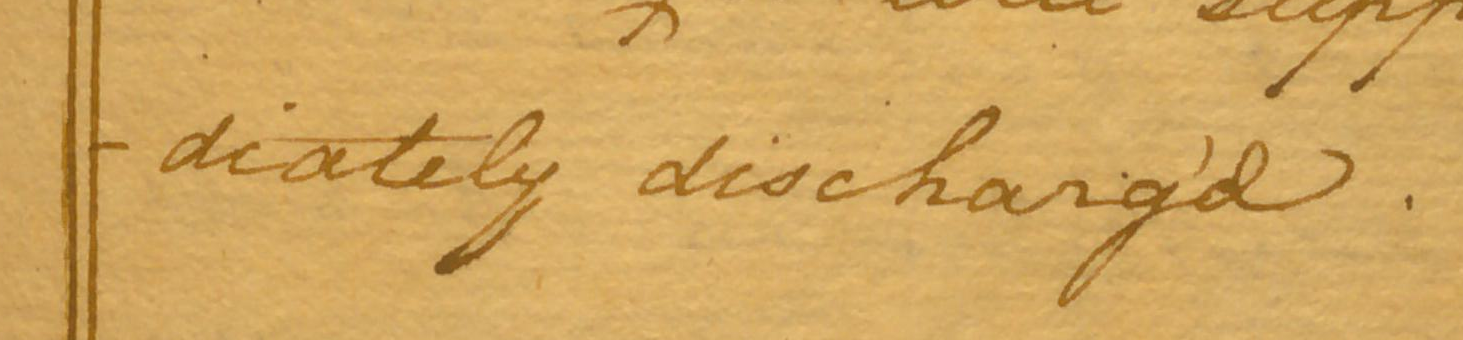-diately discharg'd.
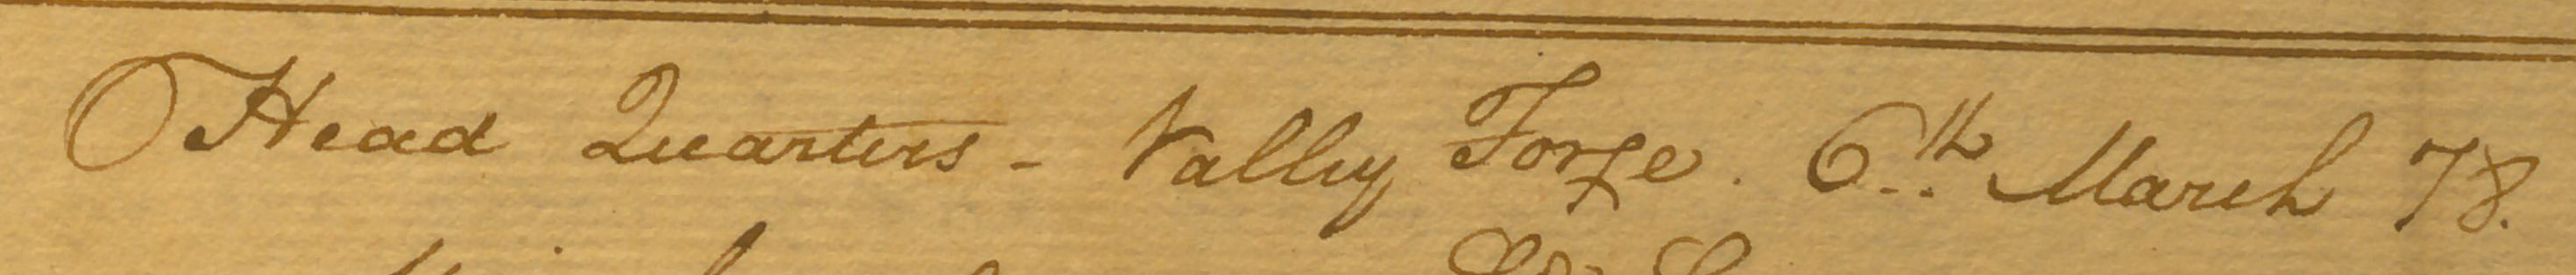Head Quarters. Valley Forge. 6^th. March 78.
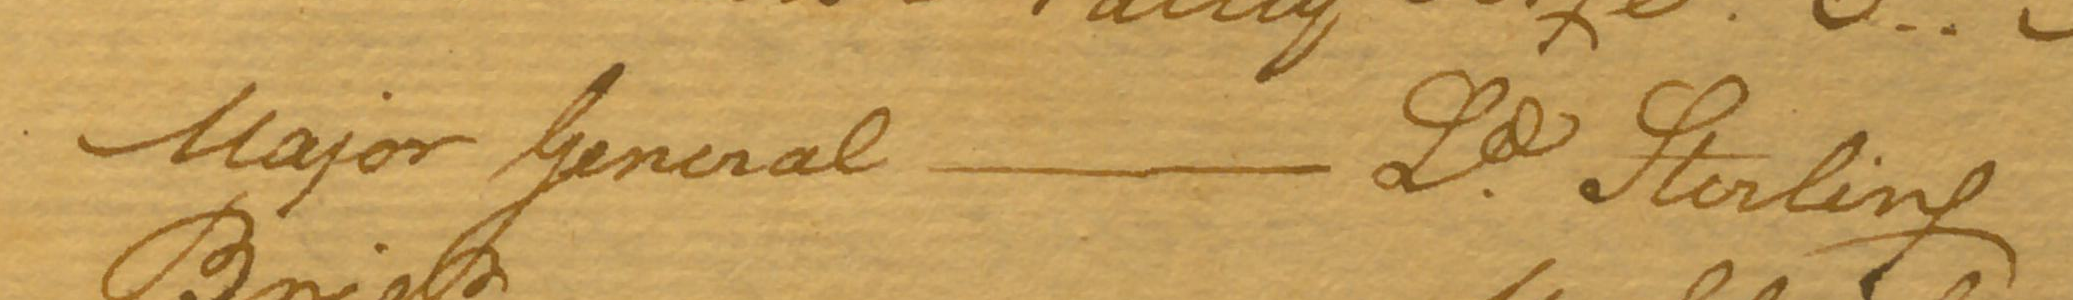Major General- L^d. Sterling
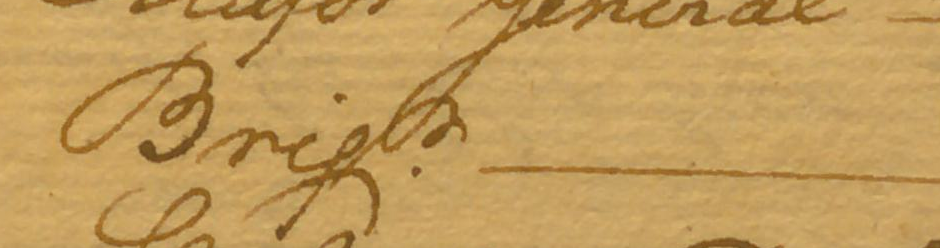Brig^r.-
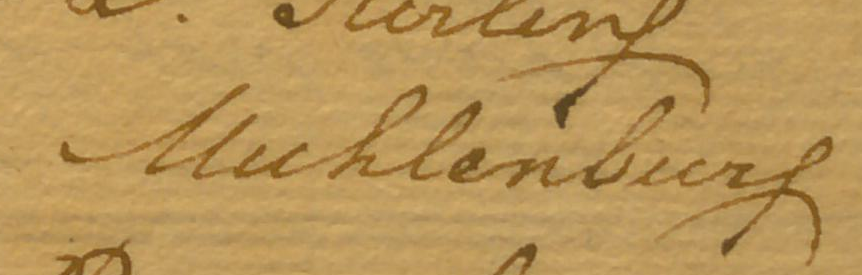Muhlenburg
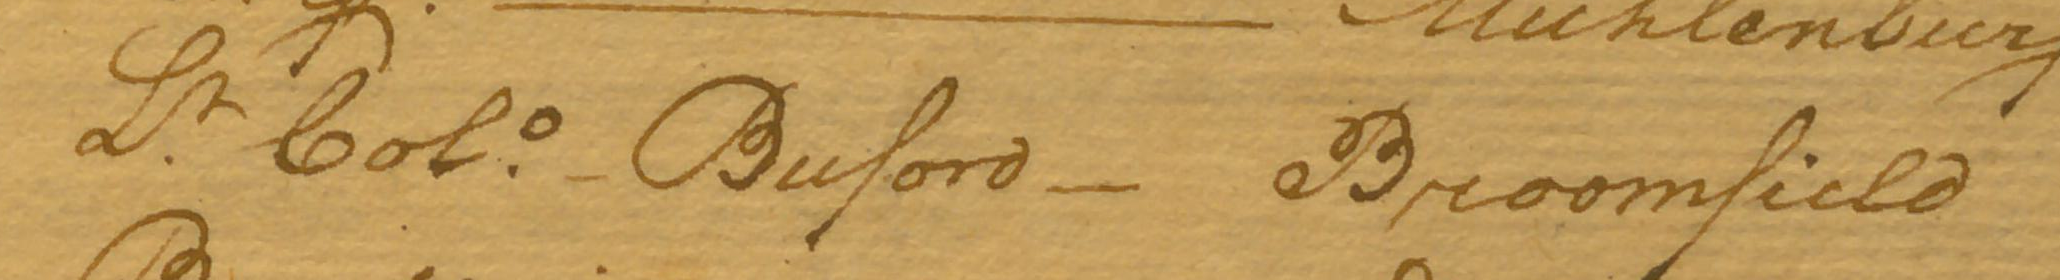L^t. Col^o. Buford- Broomfield
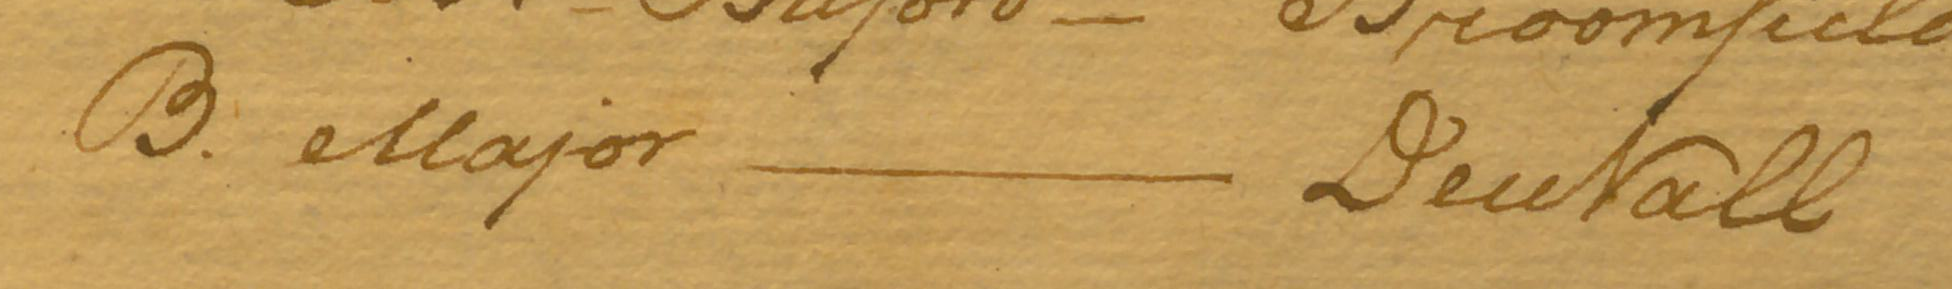B. Major- DeuVall
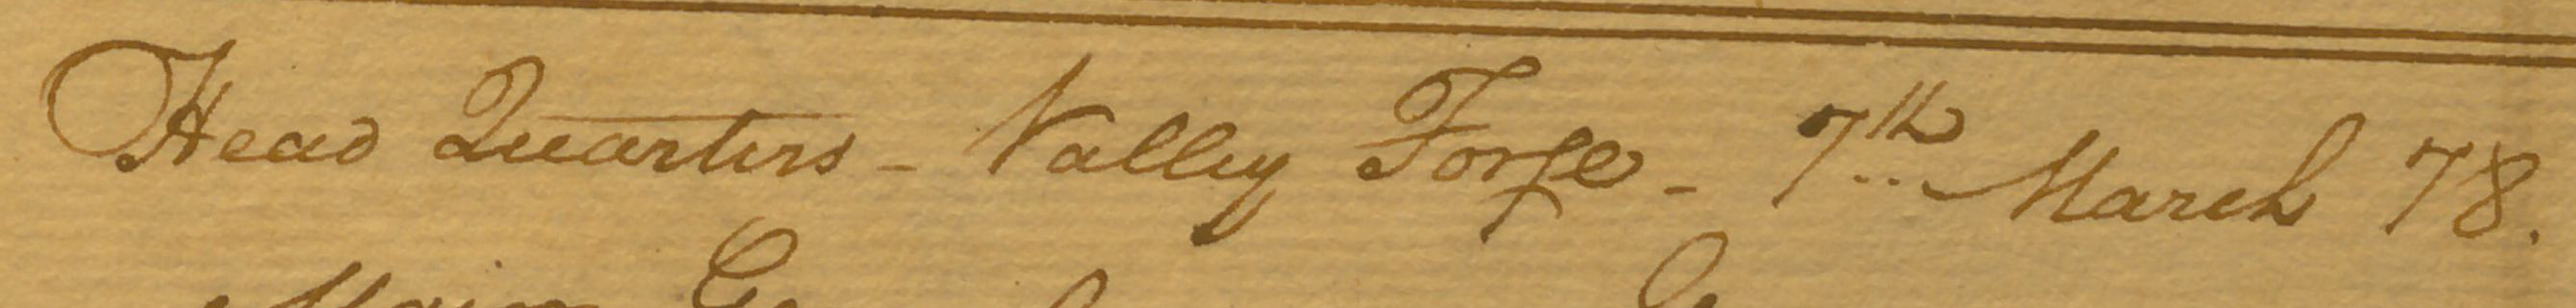Head Quarters- Valley Forge- 7^th. March 78.
